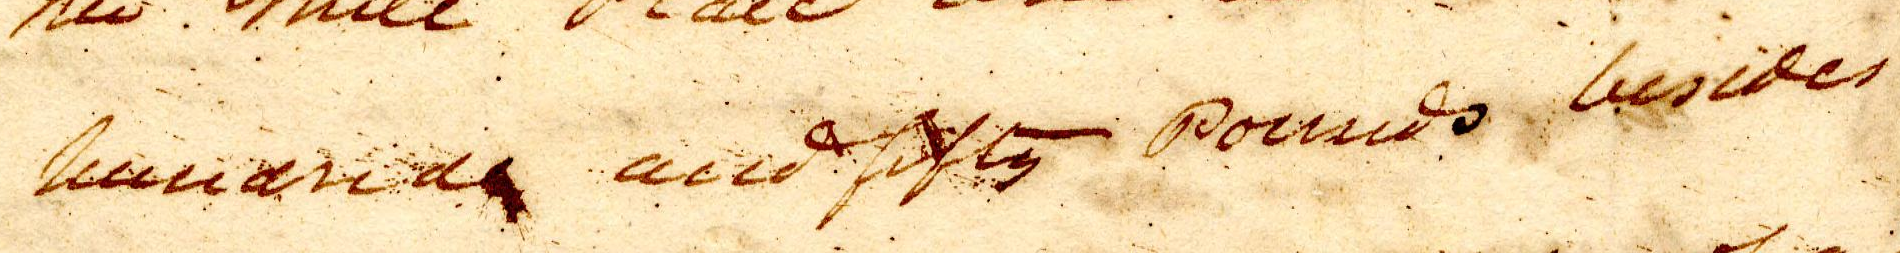hundred accd fifty Pounds besides.
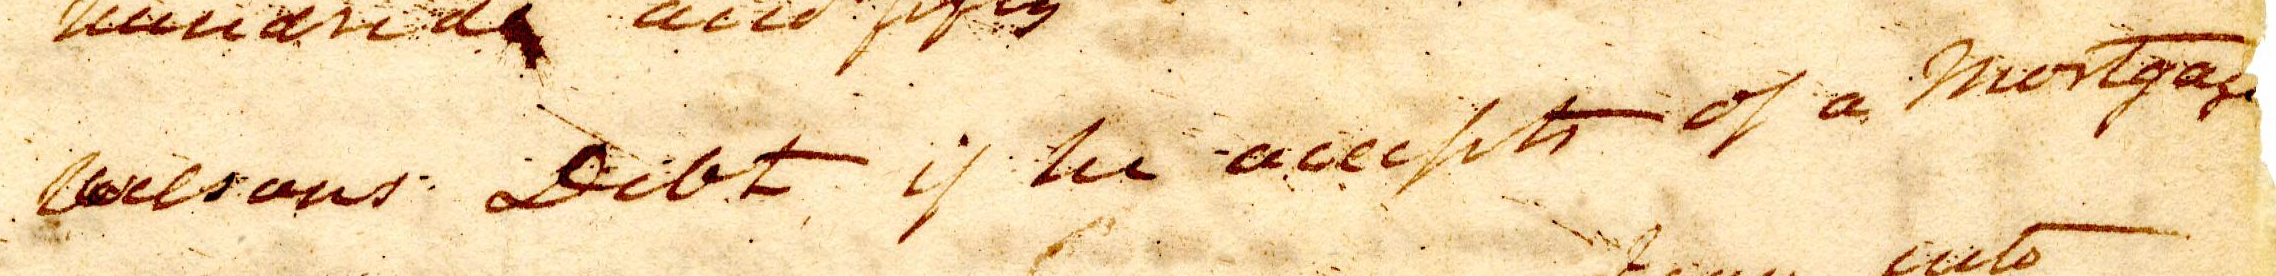Wilsons Debt if he accepts of a Mortgage
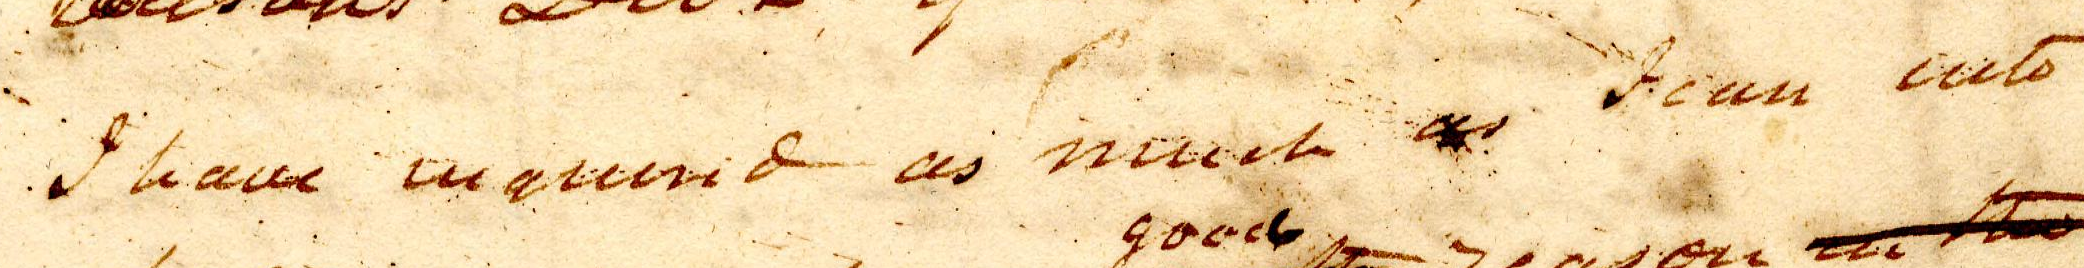I have inquired as much & I can act
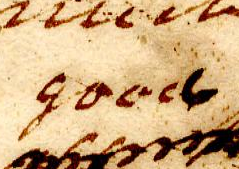good
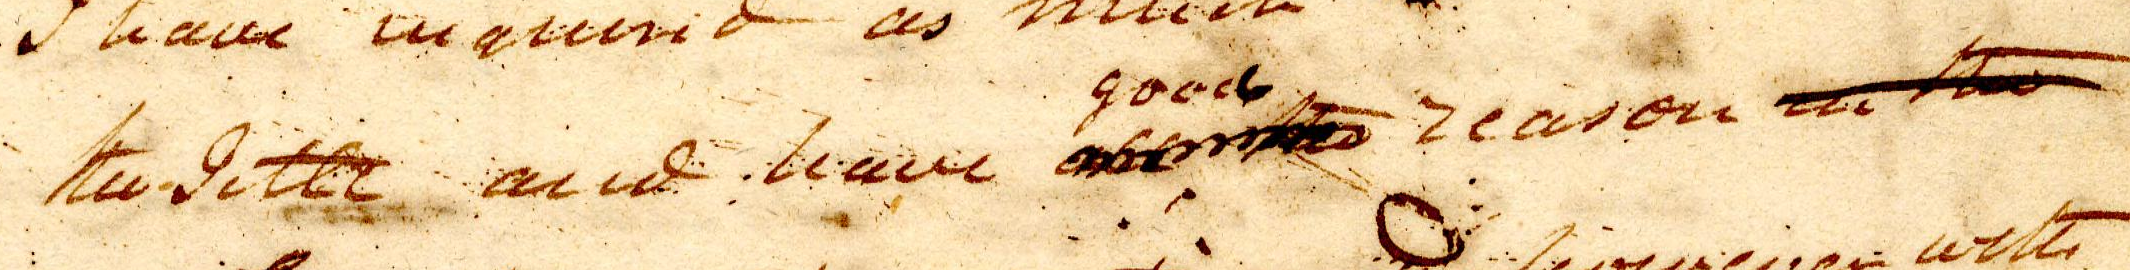to setle and leave [accomts] reason [in the]
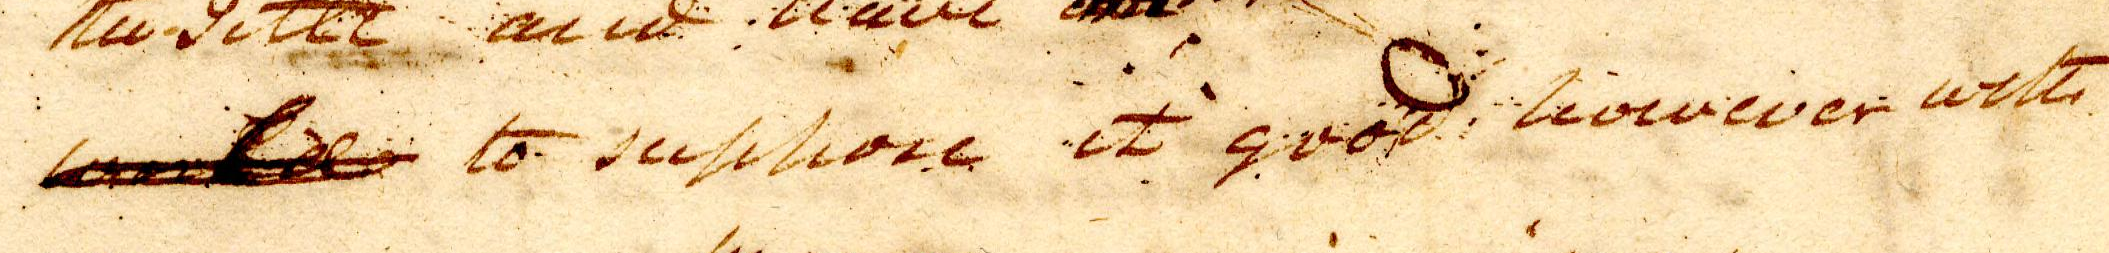[________] to suppose it good however with
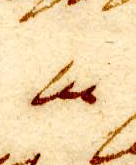be
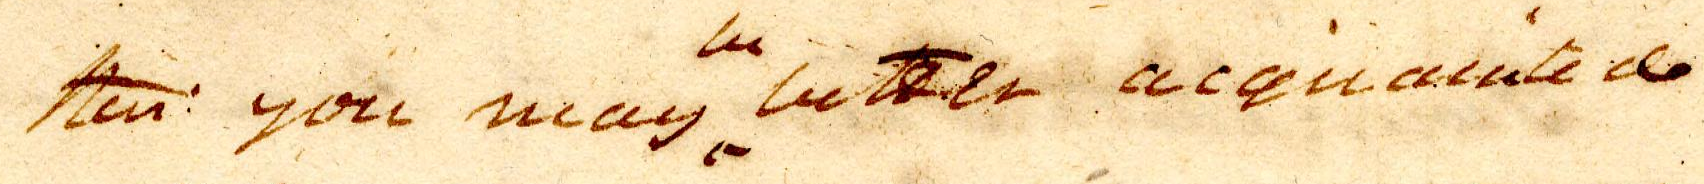then you may ^ better acquainted
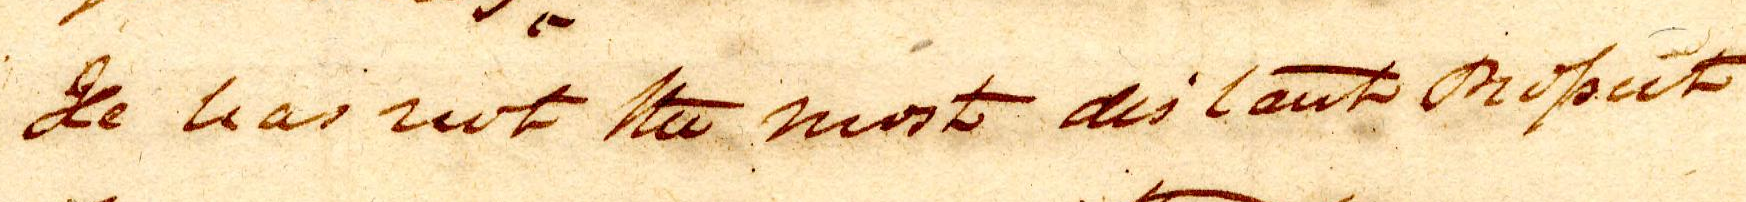He has not thee most distant Prospect
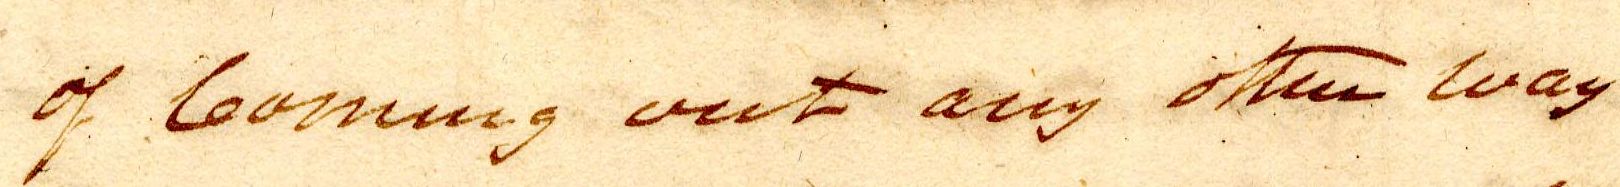of Coming out any other way
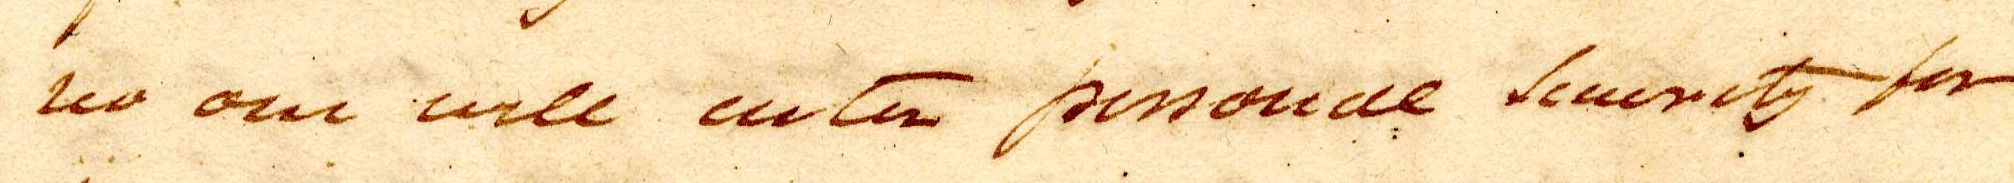[__] our will enter personal Security for
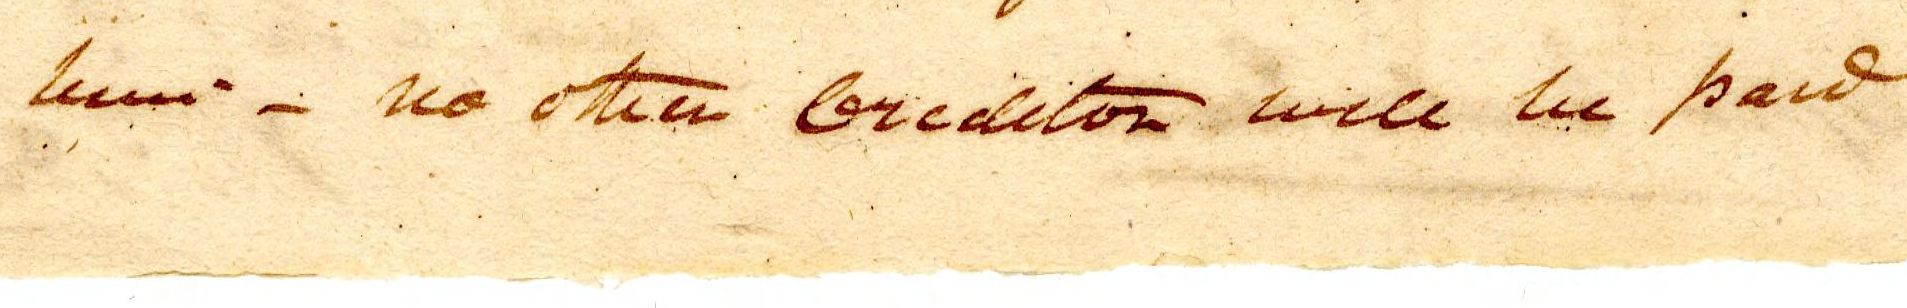him- no other Creditor will be paid
